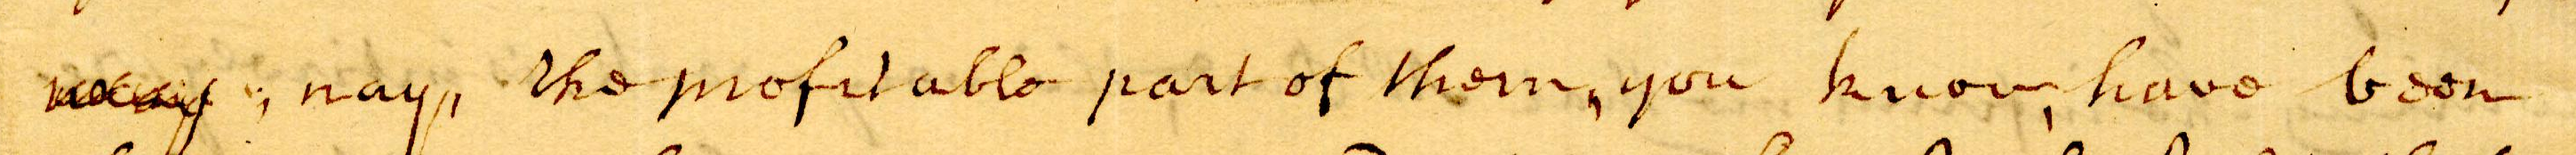[____]; nay, the profitable part of them, you know, have been
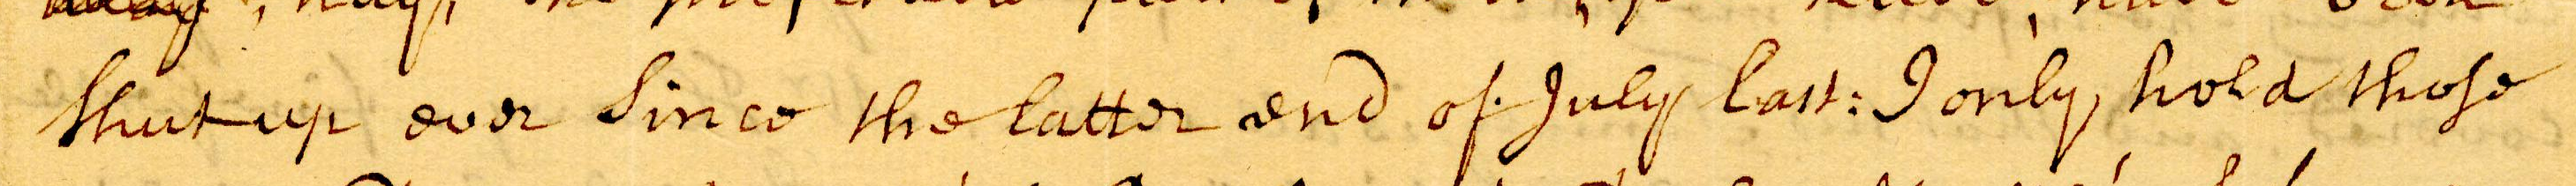shut up ever since the latter end of July last: I only hold those
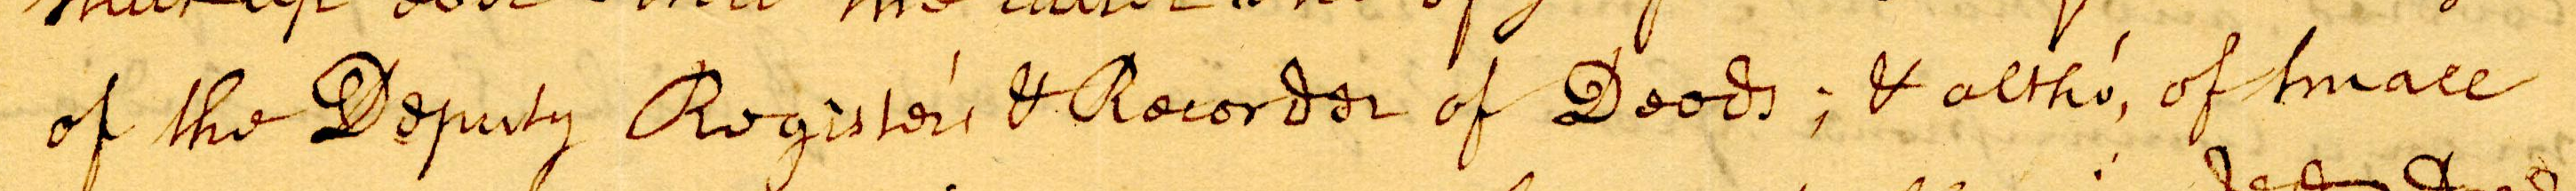of the Deputy Register's & Recorder of Deeds; & altho', of small
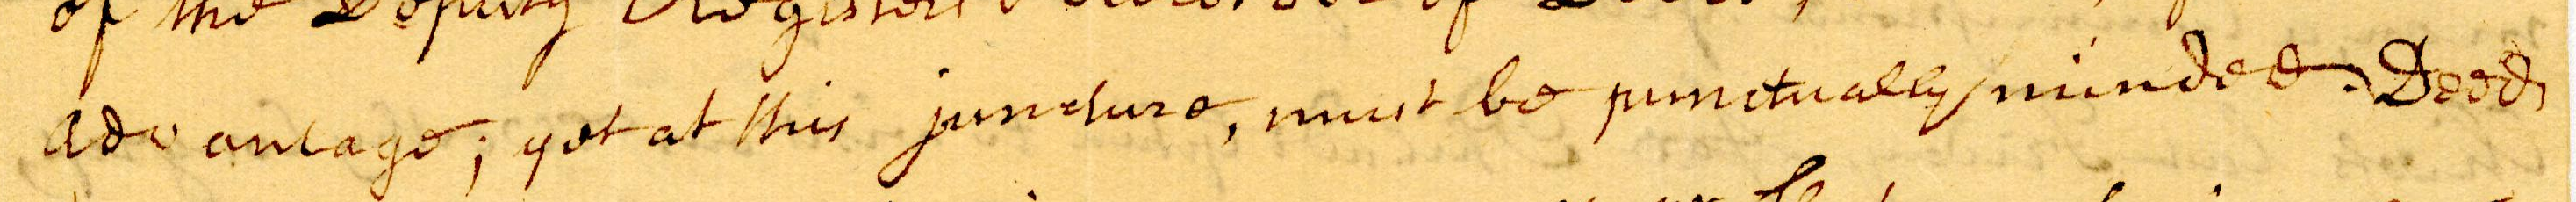advantage; yet at this juncture, must be punctually minded. Deeds
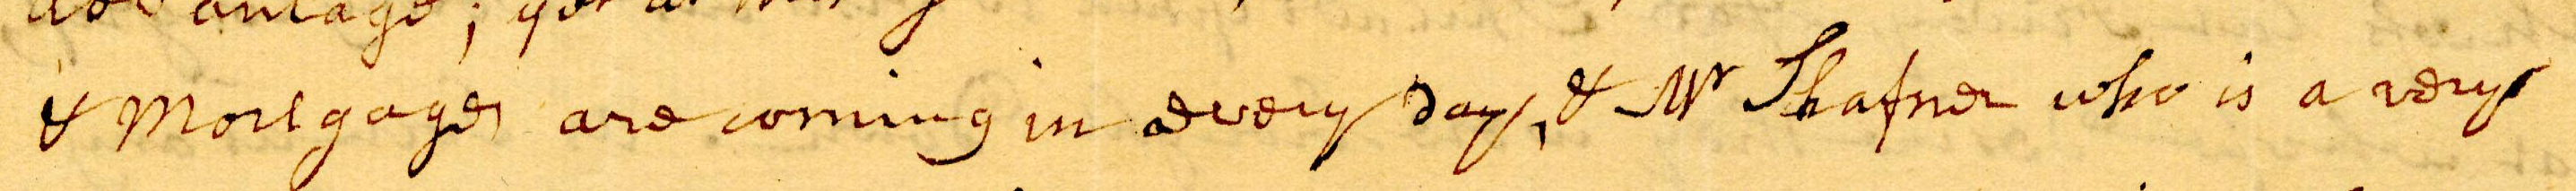& Mortgages are coming in every day, & M^r Shafner who is a very
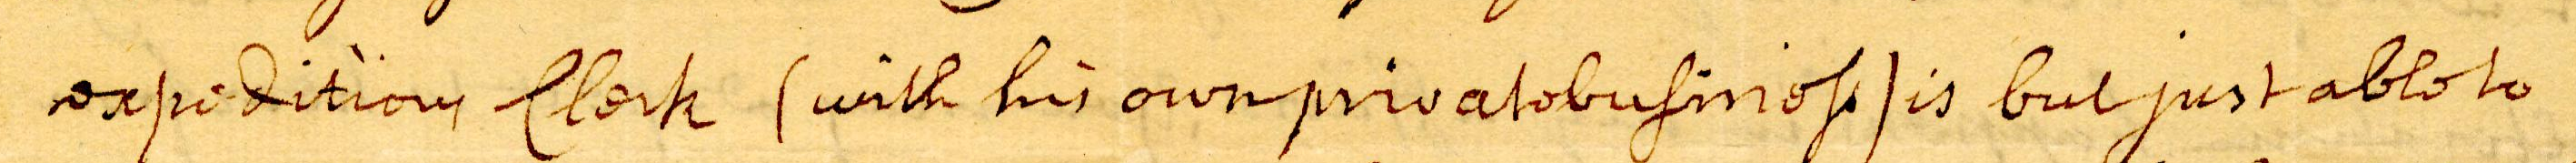expeditious Clerk (with his own private business) is but just able to
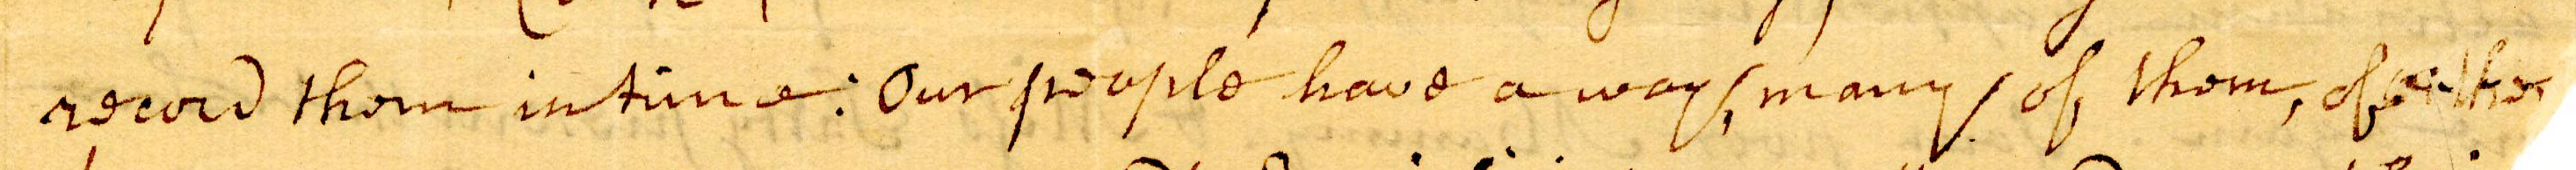record them in time: Our people have a way, many of them, of [____]
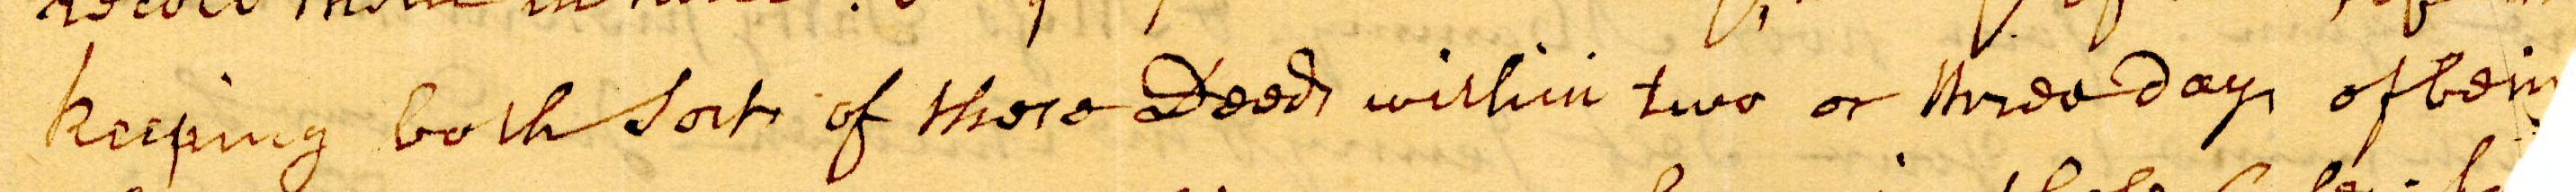keeping both Sort of these Deeds within two or three days of being
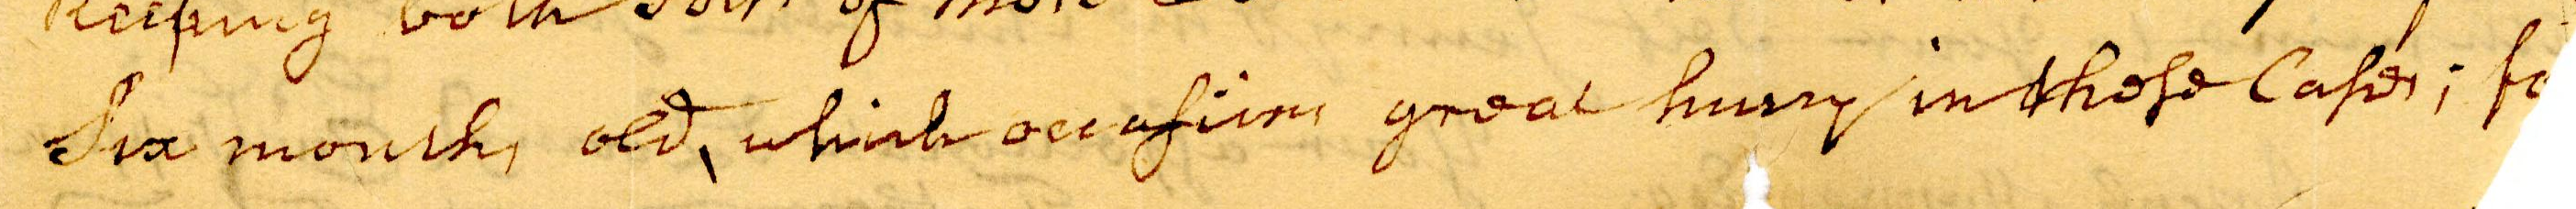six months old, which occasions great hurry in those Cases; f[_]
